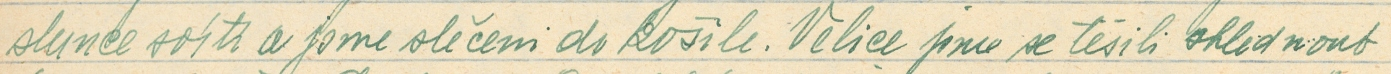slunce svítí a jsme slečeni do košile. Velice jsme se těšili zhlednout
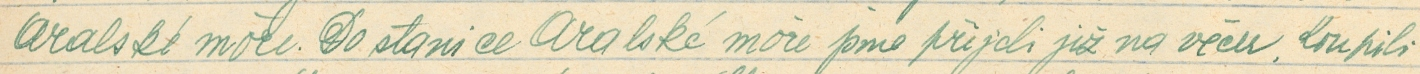Aralské moře. Do stanice Aralské moře jsme přijeli již na večer. Koupili
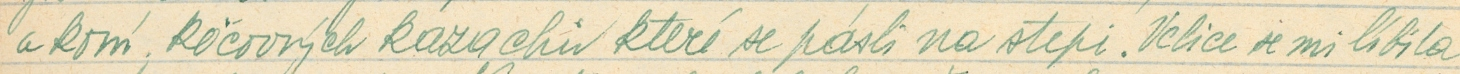a koní kočovných kazachů které se pásli na stepi. Velice se mi líbila
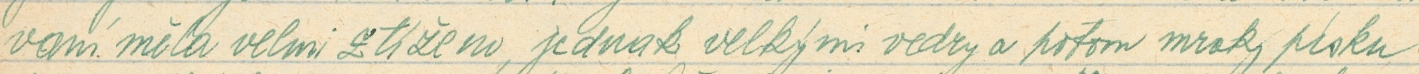vaní měla velmi ztíženo, jednak velkými vedry a potom mraky písku
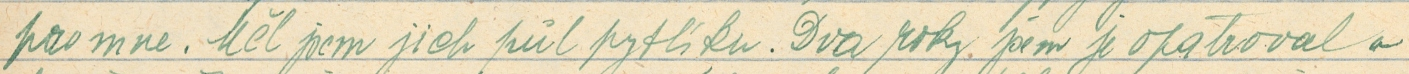pro mne. Měl jsem jich půl pytlíku. Dva roky jsem je opatroval a
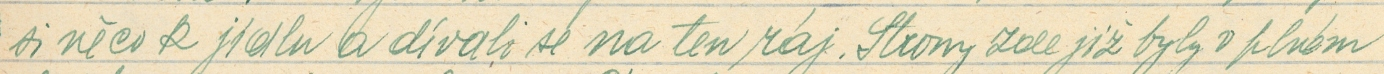si něco k jídlu a dívali se na ten ráj. Stromy zde již byly v plném
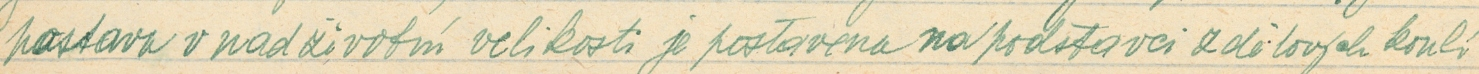postava v nadživotní velikosti je postavena na podstavci z dělových koulí
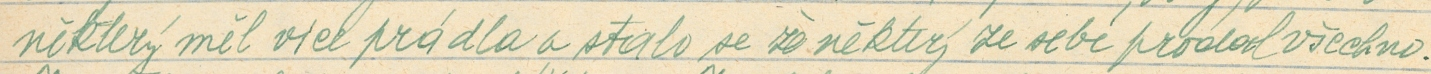některý měl více prádla a stalo se že některý ze sebe prodal všechno.
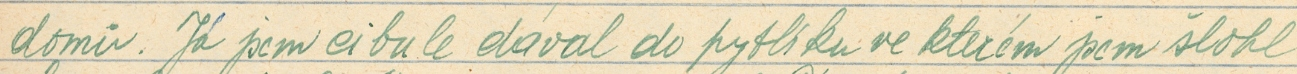domů. Já jsem cibule dával do pytlíku ve kterém jsem šlohl
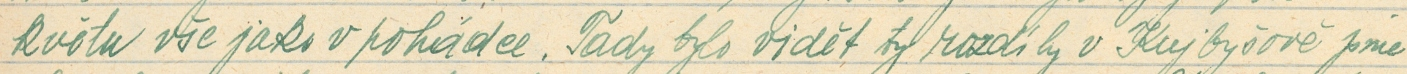květu vše jako v pohádce. Tady bylo vidět ty rozdíly v Kujbyšově jsme
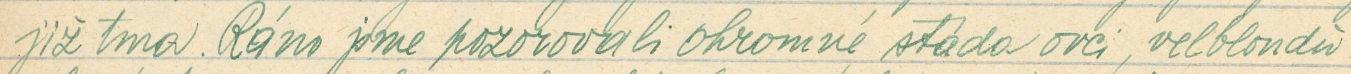již tma. Ráno jsme pozorovali ohromné stáda ovci, velbloudů,
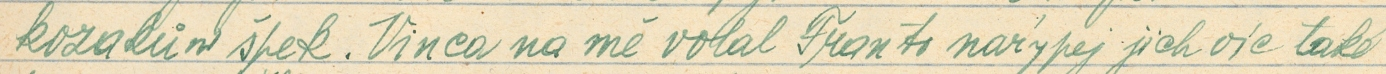kozakům špek. Vinca na mě volal Franto narýpej jich víc také
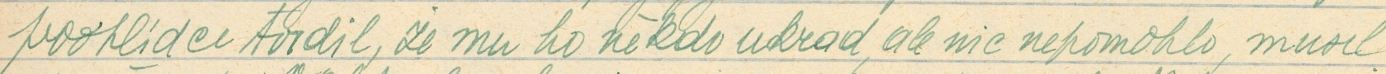prohlídce tvrdil, že mu ho někdo ukrad, ale nic nepomohlo, musel
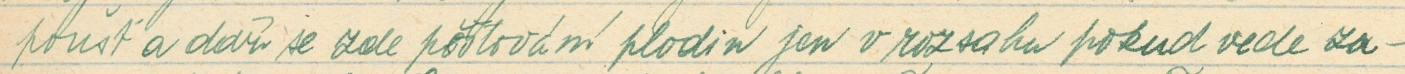poušť a daří se zde pěštování plodin jen v rozsahu pokud vede za-
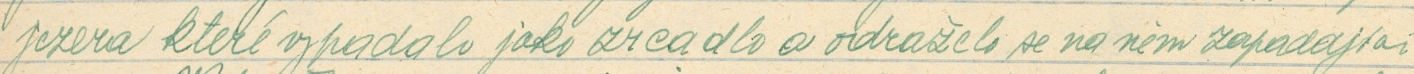jezera které vypadalo jako zrcadlo a odraželo se na něm zapadající
